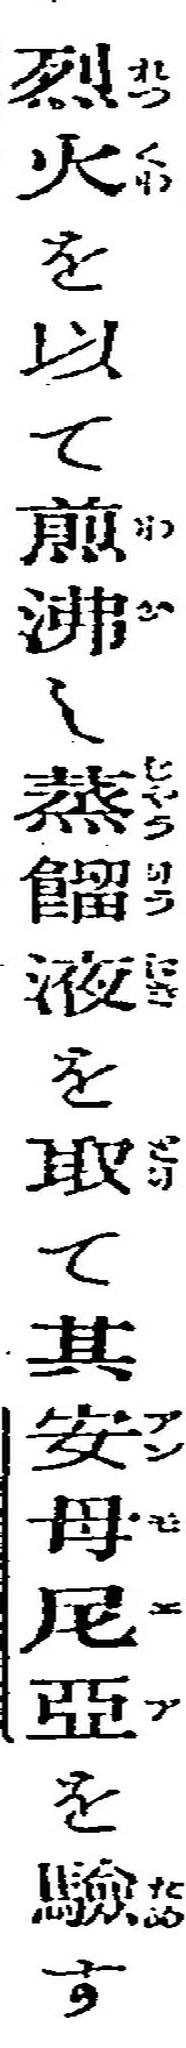烈火を以て煎沸し蒸餾液を取て其安母尼亞を験す
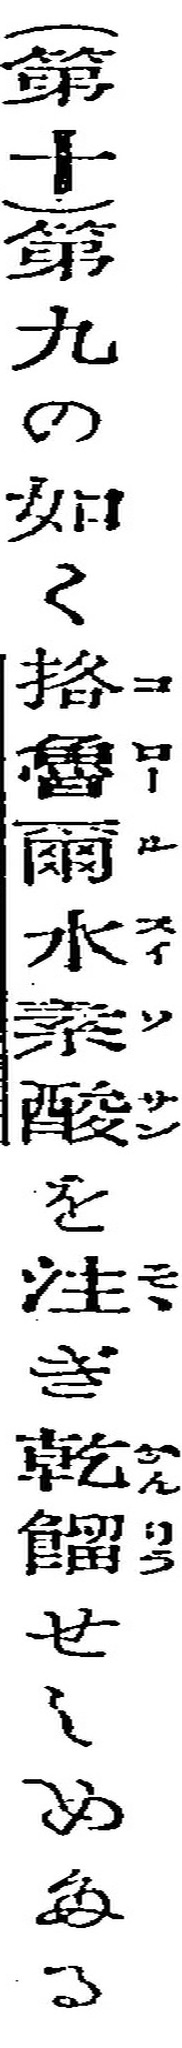[第十]第九の如く挌魯爾水素酸を注き乾餾せしめたる
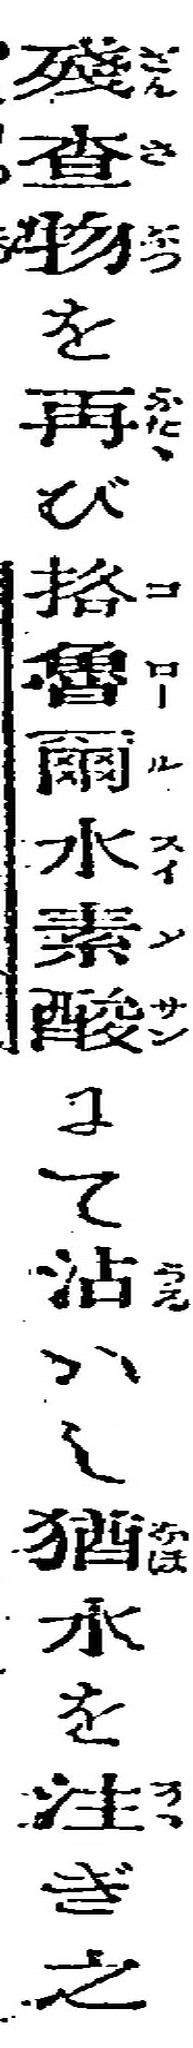残渣物を再び挌魯爾水素酸にて沾はし猶水を注ぎ之
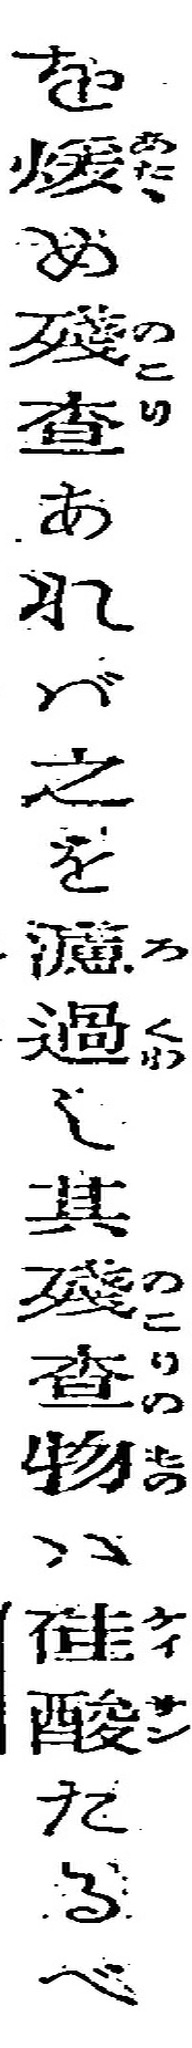を煖め残渣あれば之を濾過し其残査物は珪酸たるべ
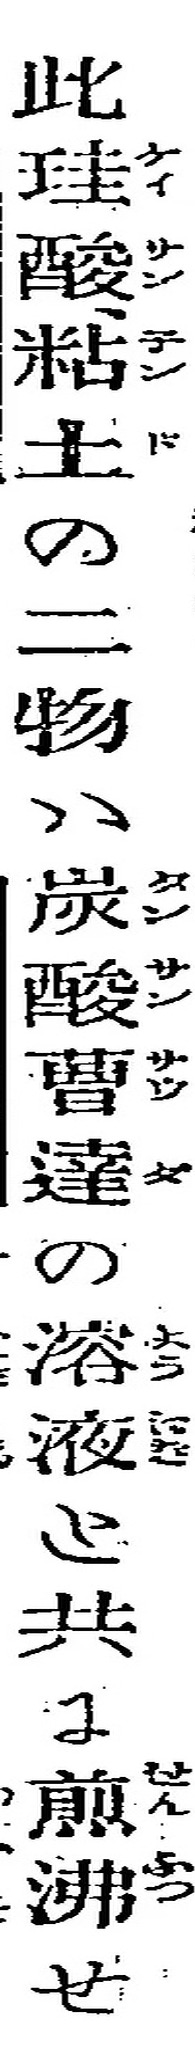し若其珪酸粘土の二物は炭酸曹達の容積と共に煎沸せ
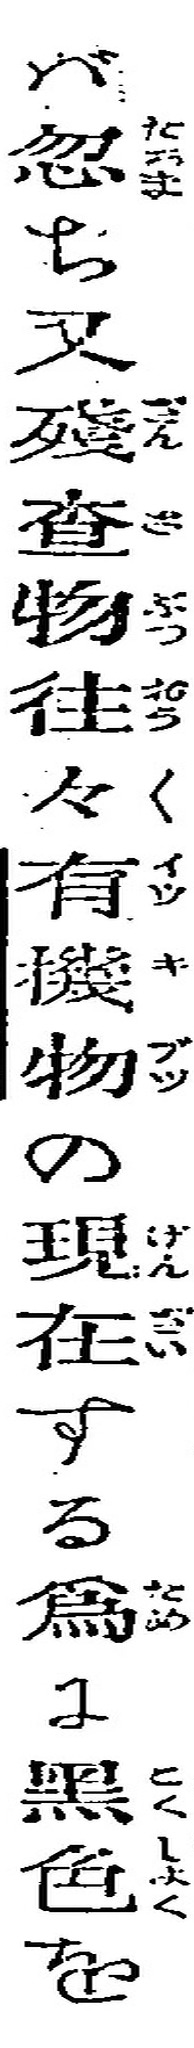ば忽ち又残査物往々有機物の現在する為に黒色を
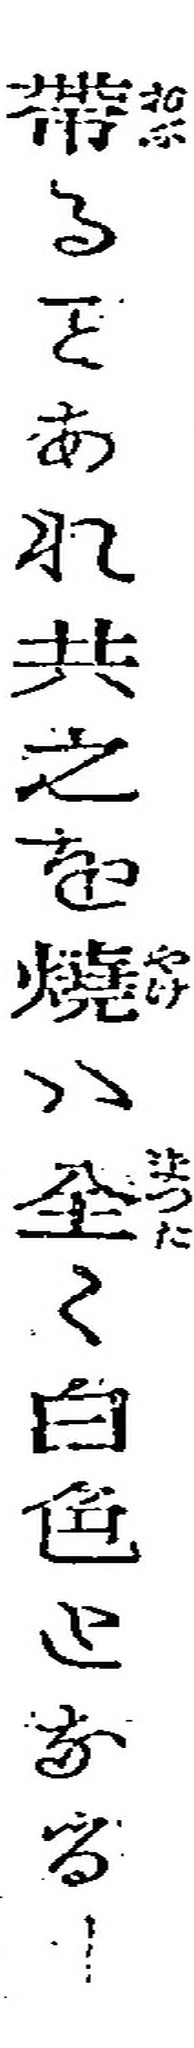帯ることあれ共之を焼は全く白色となる
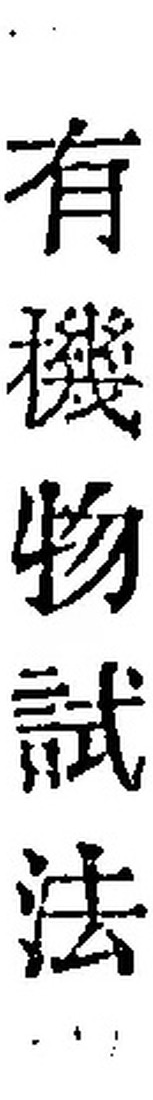有機物試法
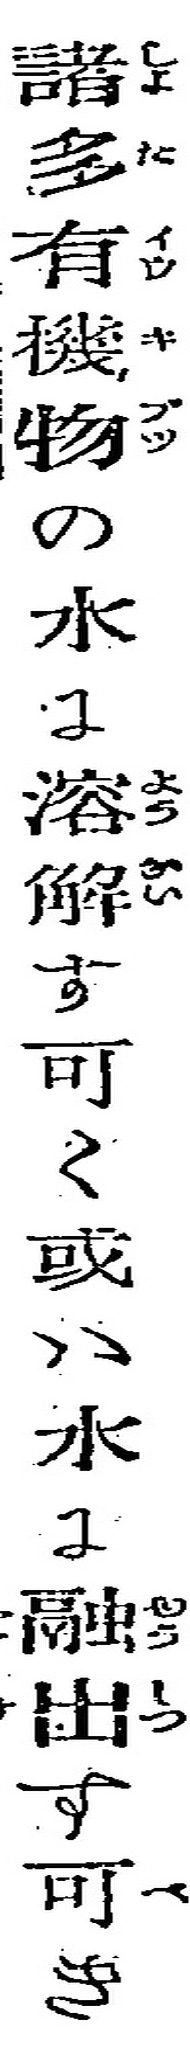諸多有機物の水に溶解す可く或は水に融出す可き
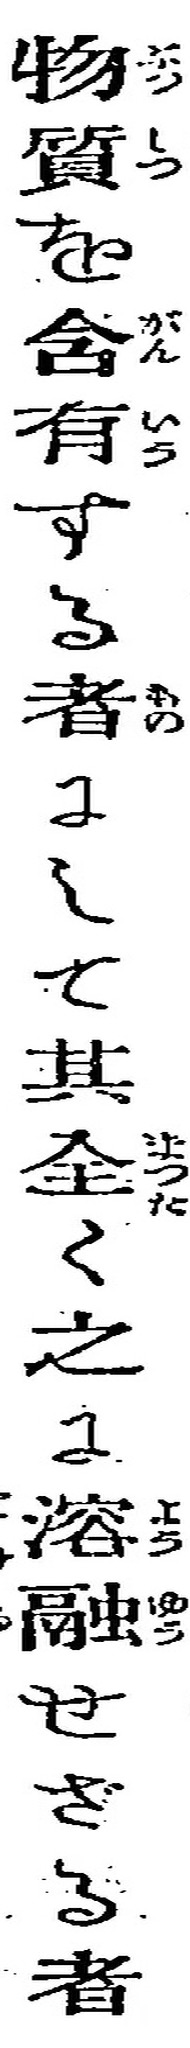物質を含有する者にして其全く之に溶融せざる者
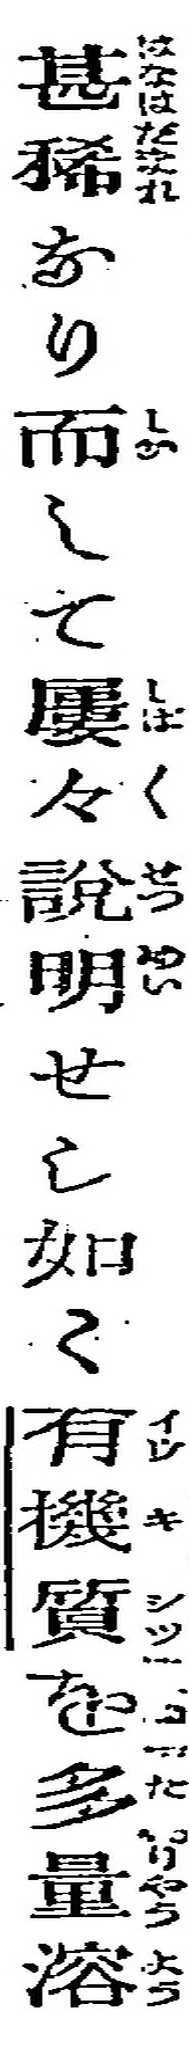甚稀なり而して屡々説明せし如く有機質を多量溶
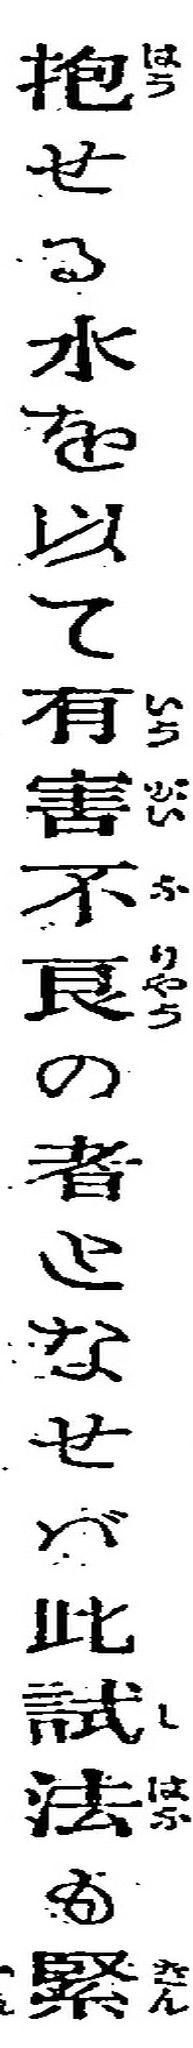抱せる水を以て有害不良の者となせば此試法も緊

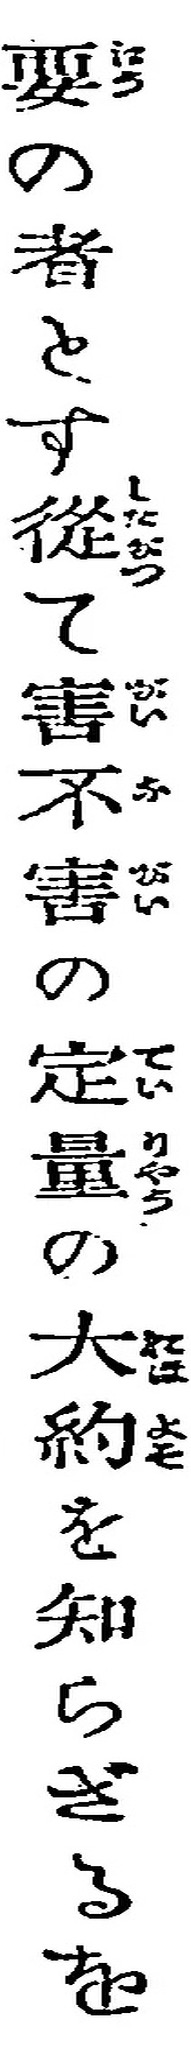要の者とす従て害不害の定量の大約を知らざるを
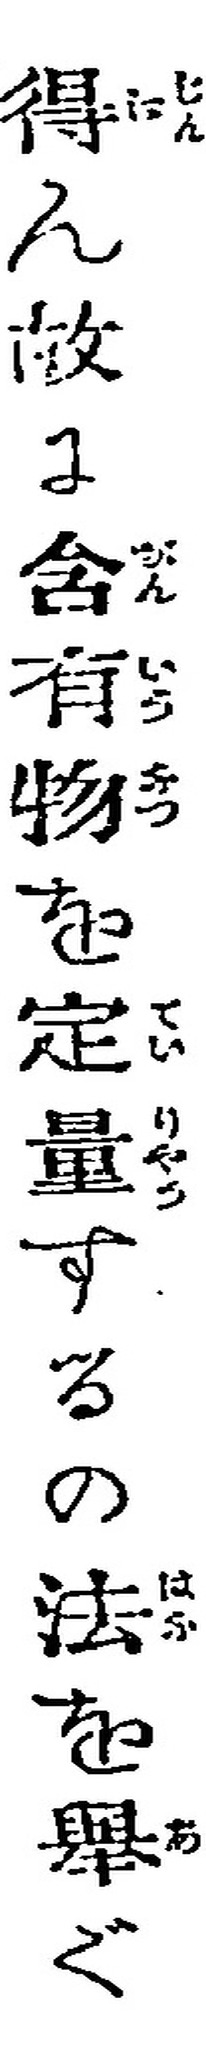得ん故に含有物を定量するの法を挙ぐ
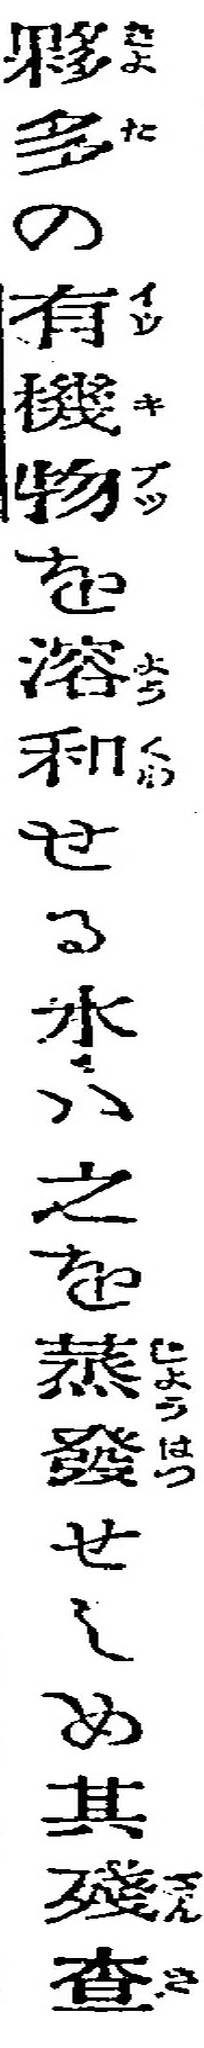夥多の有機物を溶和せる水は之を蒸發せしめ其残査
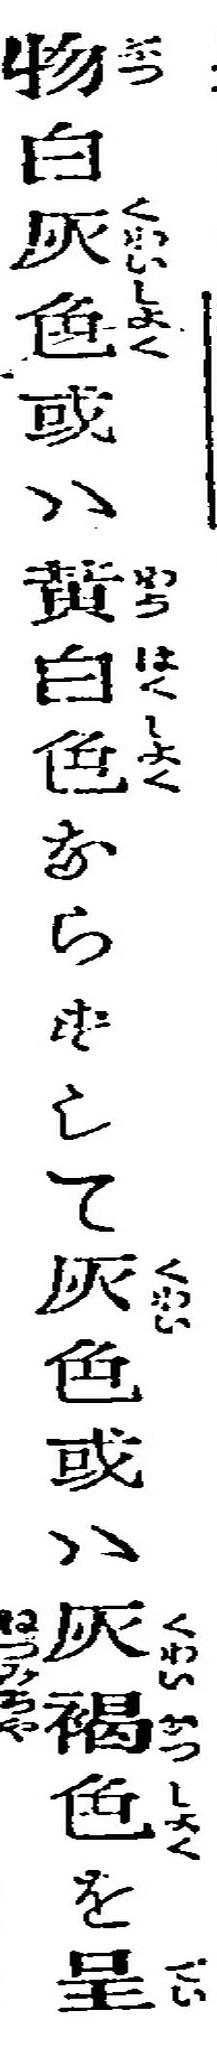物白灰色或は黄白色ならずして灰色或は灰褐色を呈
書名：飲水の心得 : 伝染病の予防
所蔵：国立国会図書館 National Diet Library, JAPAN
